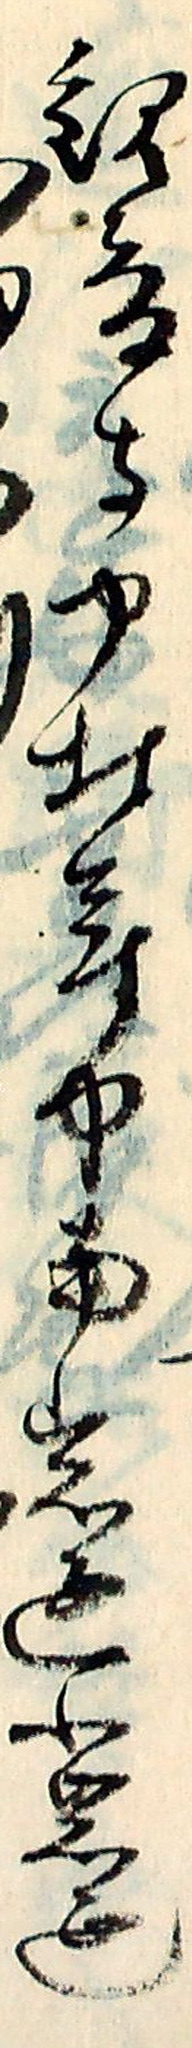観音寺中村府中南岩延北岩延
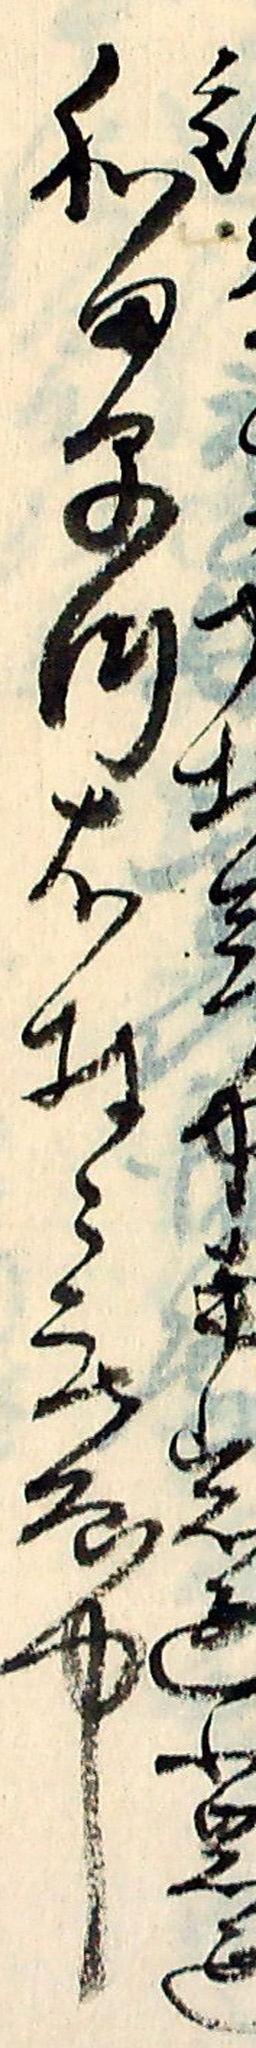和田早淵右村々庄屋中
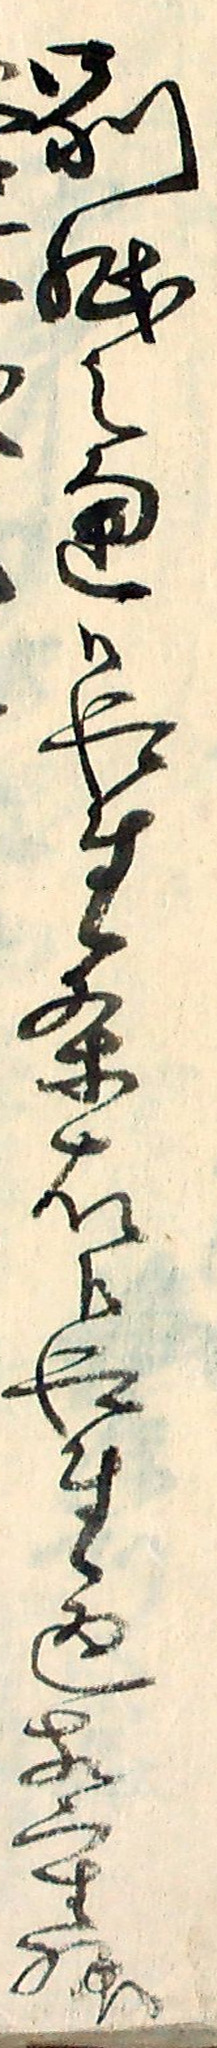別紙之通被仰付候条右被仰付候通相守様
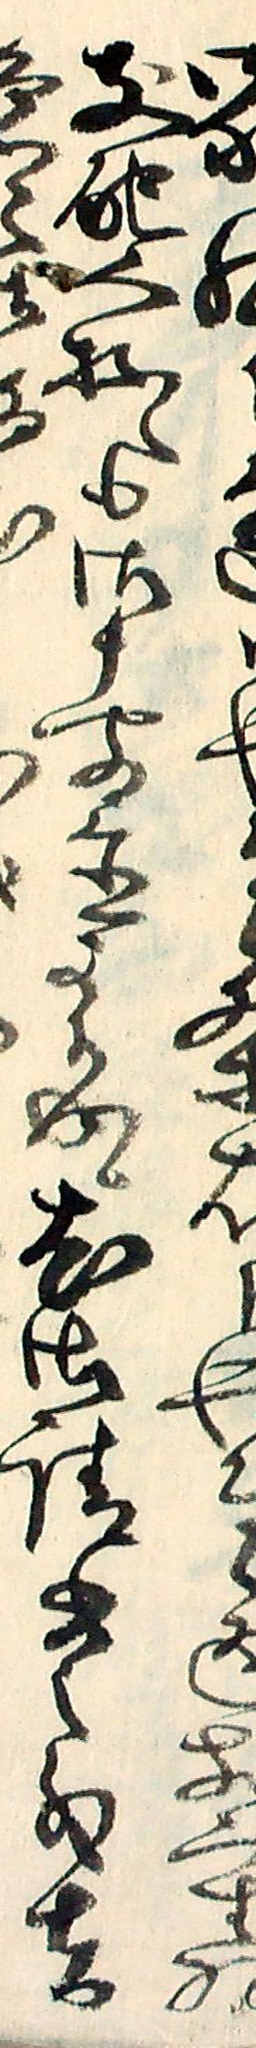支配人抔へも御申聞置可被成候尤御請書之義は

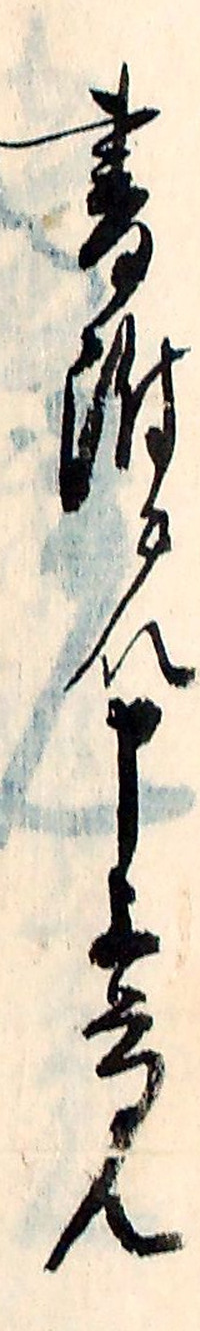書附を以申上覚
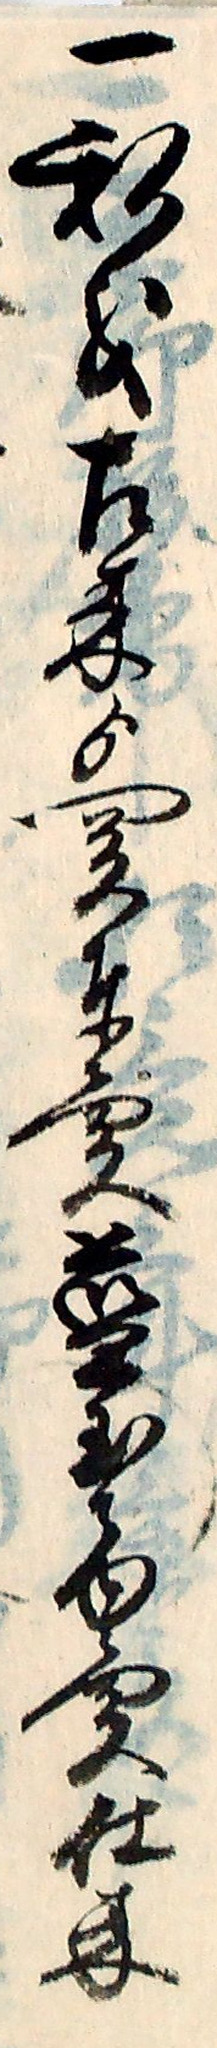一私義古来ゟ関東売藍玉商売仕来
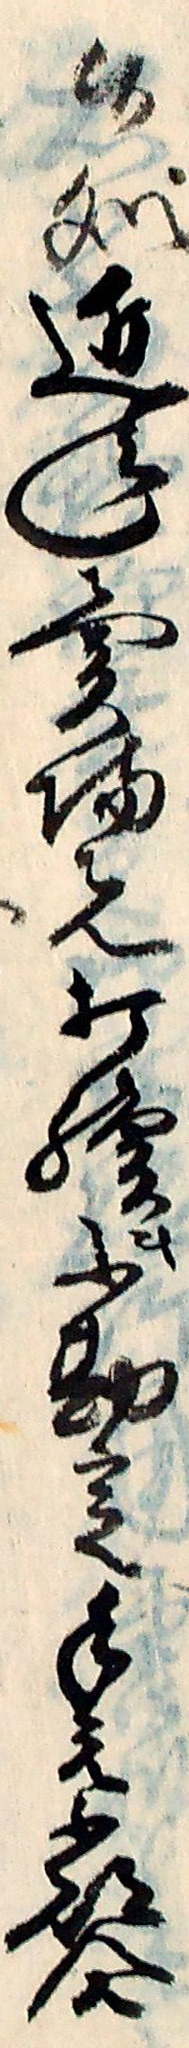候処近年売場先打続き不勘定手元不都合
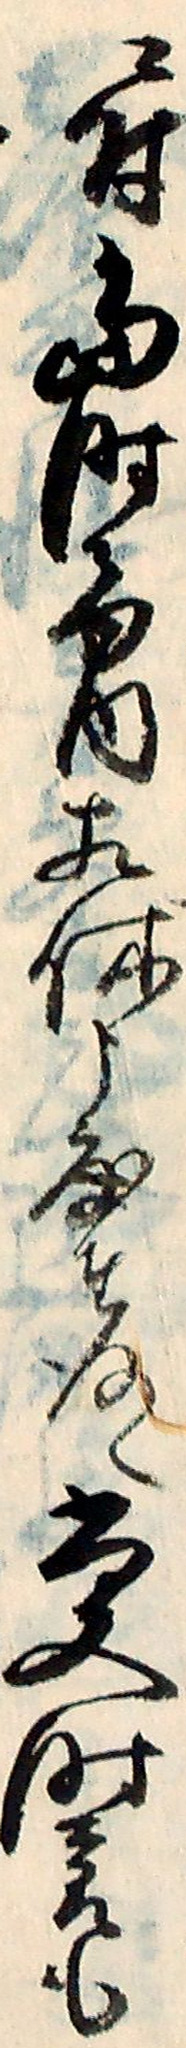に付当時商内相休申度奉存候尚又時節も
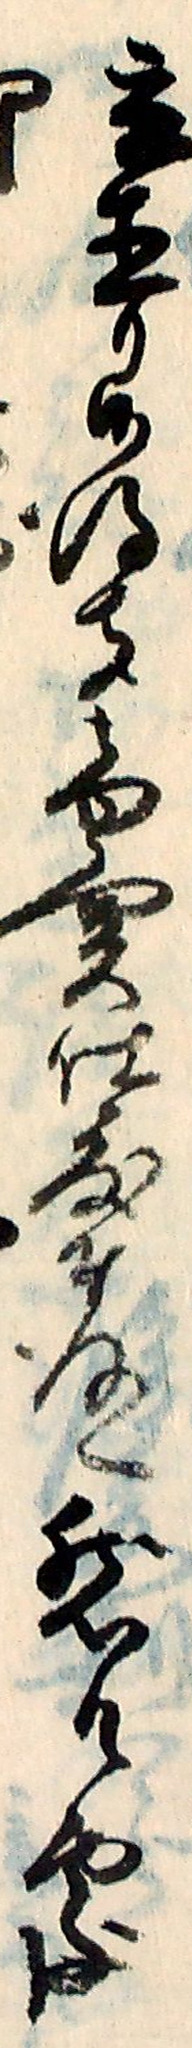立直り候得は商売仕度奉存候然る処
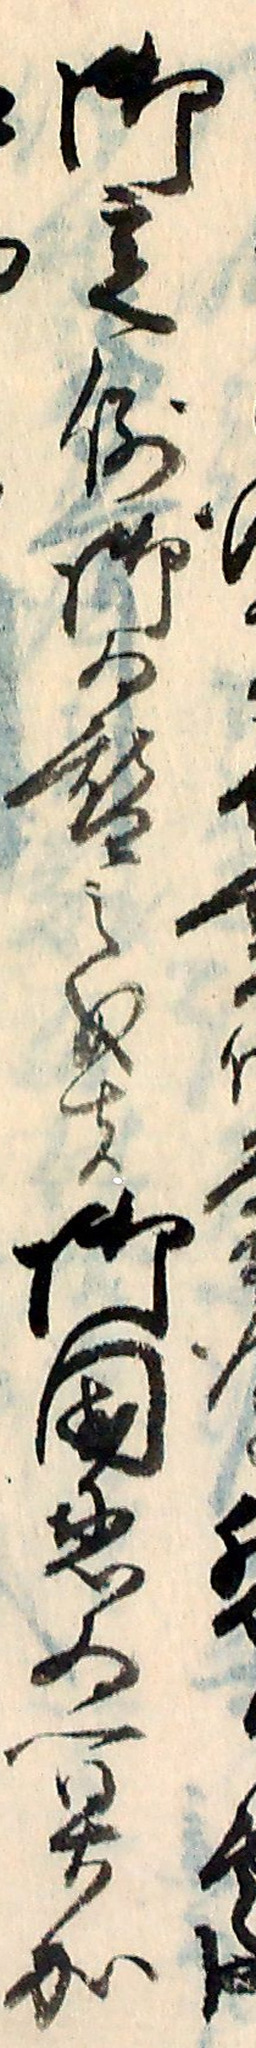御定例御為替之義は御国恩為冥加
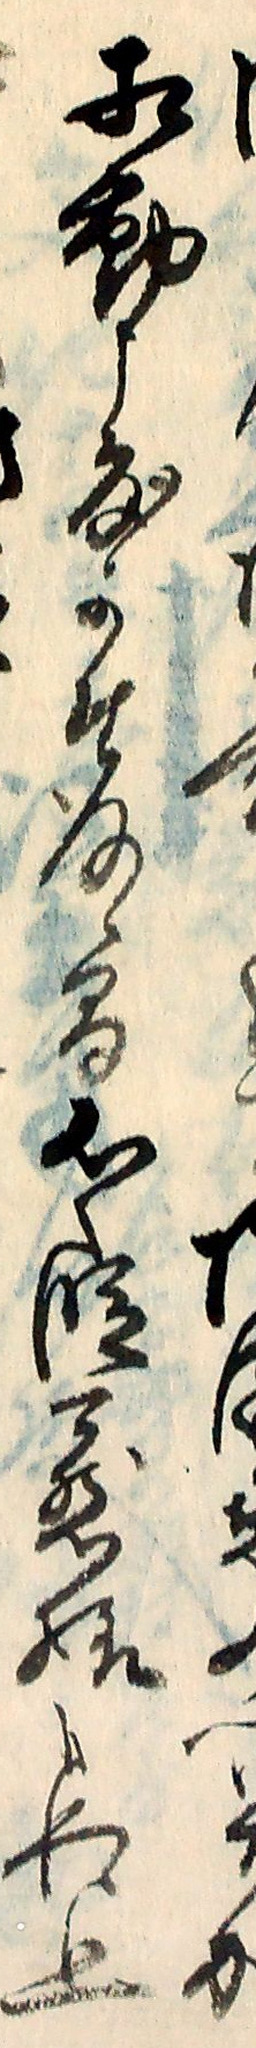相勤申度可奉存候間右之段可然様被仰上
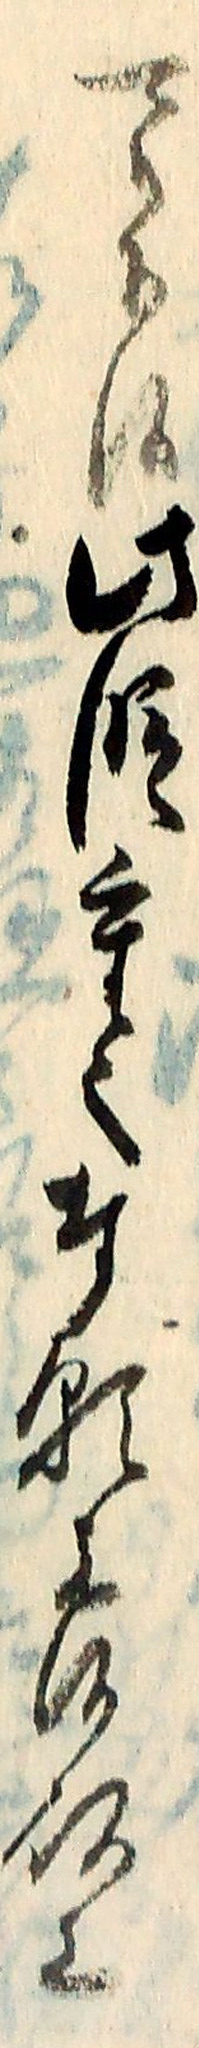可被下候此段重々奉願上候以上
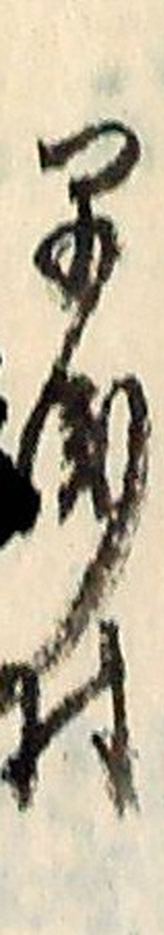早淵村
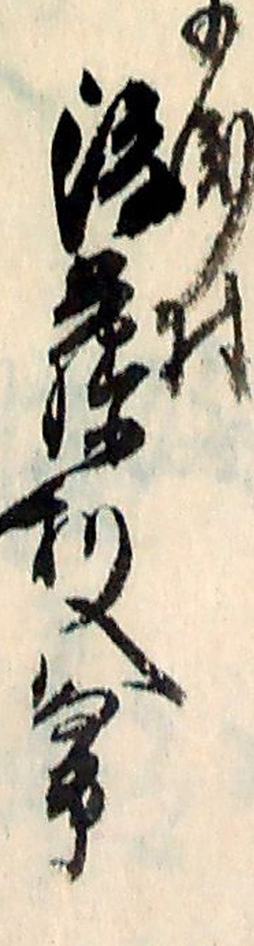後藤利八郎
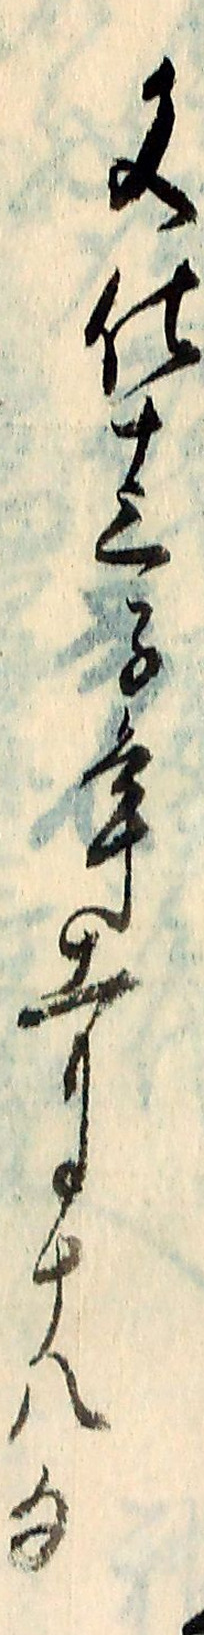文化十三子年十一月十八日
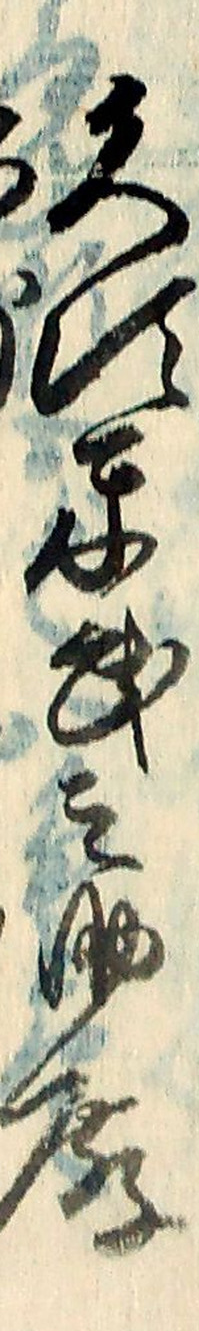久須米武之助殿
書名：諸御願書控(後藤氏壱番）
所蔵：鳴門教育大学 Naruto University of Education
